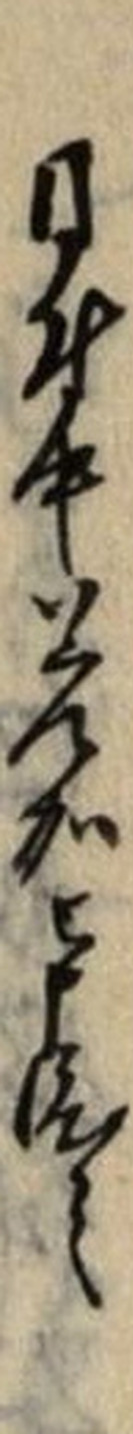目付中差加被申渡之
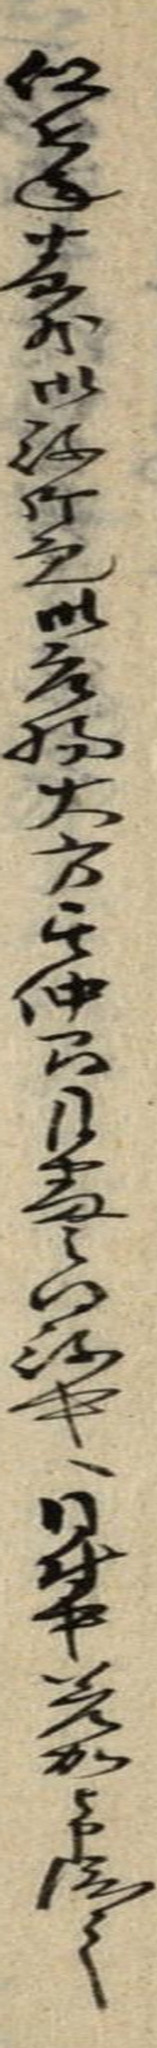但近年番外御役御免御取揚大方其仲間月番之同役中へ目付中差加被申渡之
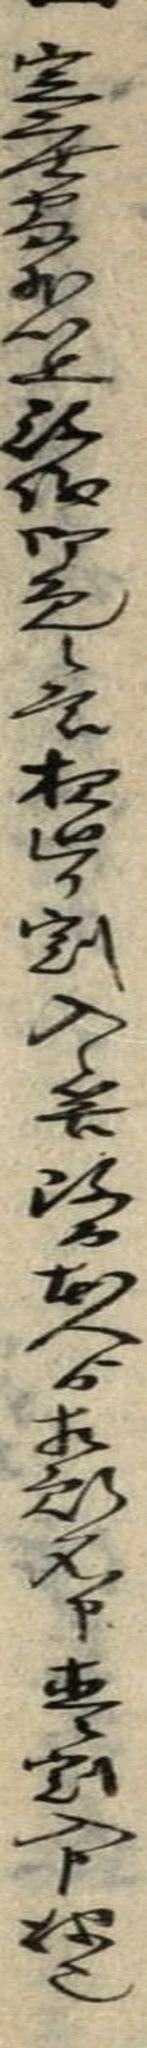一定座番外以上役儀御免之節夜廻り割入候筈改而本人ゟ相願不申直に割入申儀也
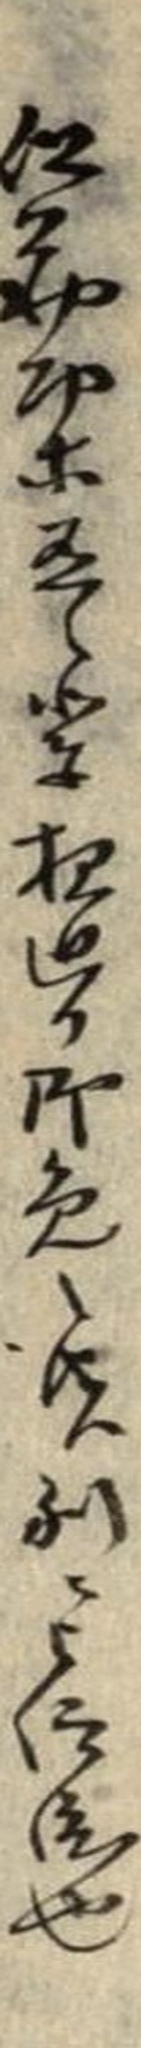但勤功等有之輩夜廻り御免之儀は別に被仰渡候也
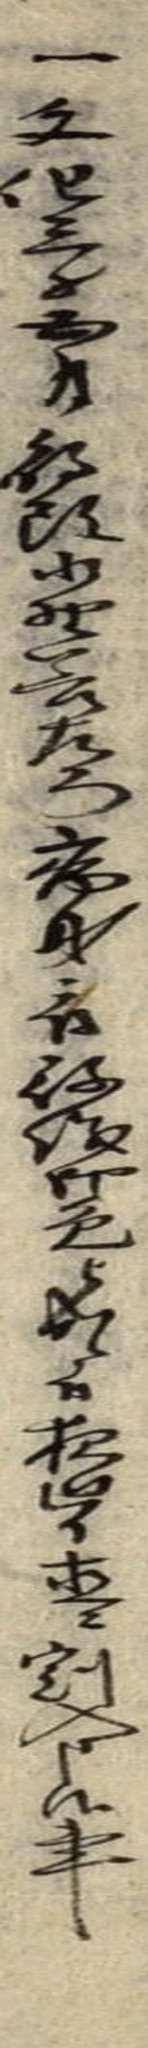一文化三寅五月触頭水野善左衛門病身に付役儀御免被成候に付夜廻り直に割入申候事
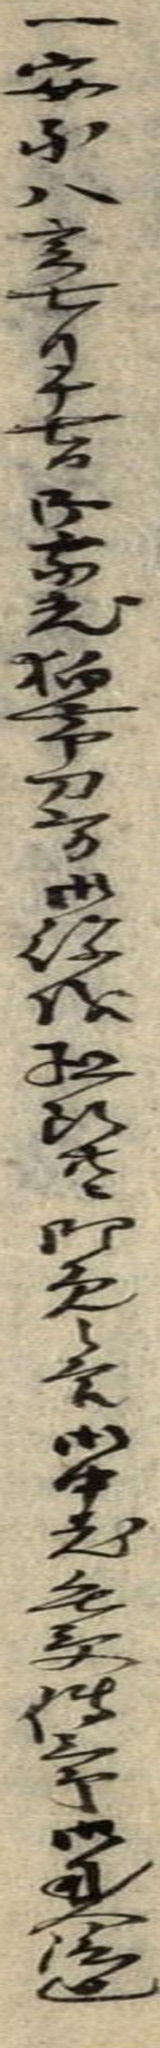一安永八亥七月十七日御家老狛帯刀方御役儀組頭共に御免候節御中老毛受伝三郎御用人渡辺
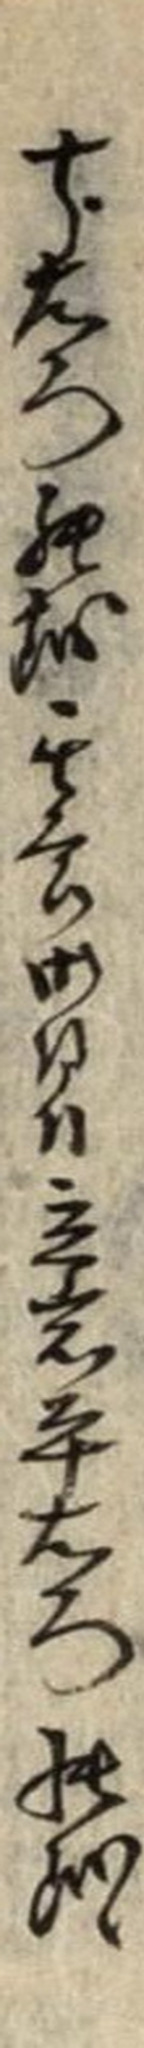十郎左衛門罷越其節御目付立岩平左衛門罷越候
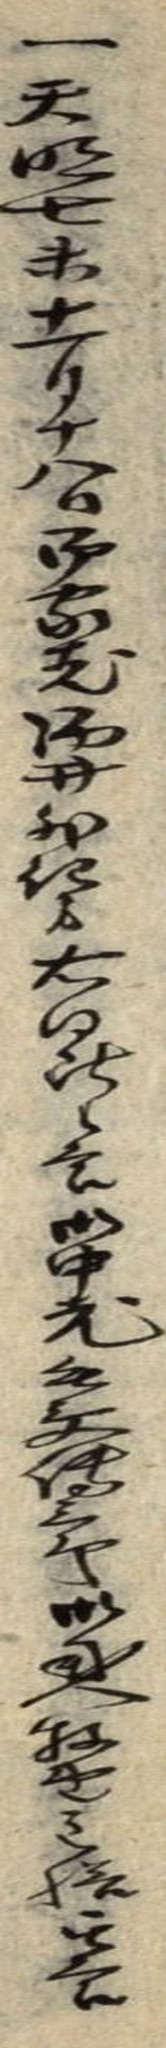一天明七未十一月十八日御家老酒井外記方右同断之節御中老毛受伝三郎御用人牧野主膳其節
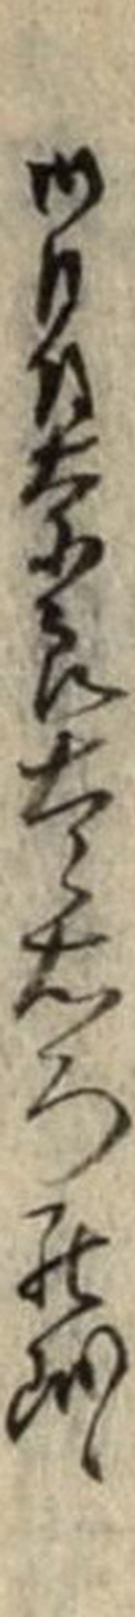御目付奈良太郎右衛門罷越候
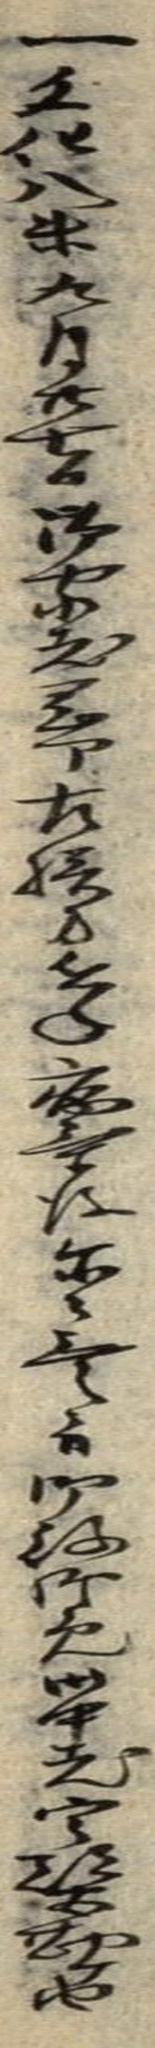一文化八未九月廿七日御家老岡部左膳方近年病気後尓々無之に付御役御免御中老宇都宮勘解由
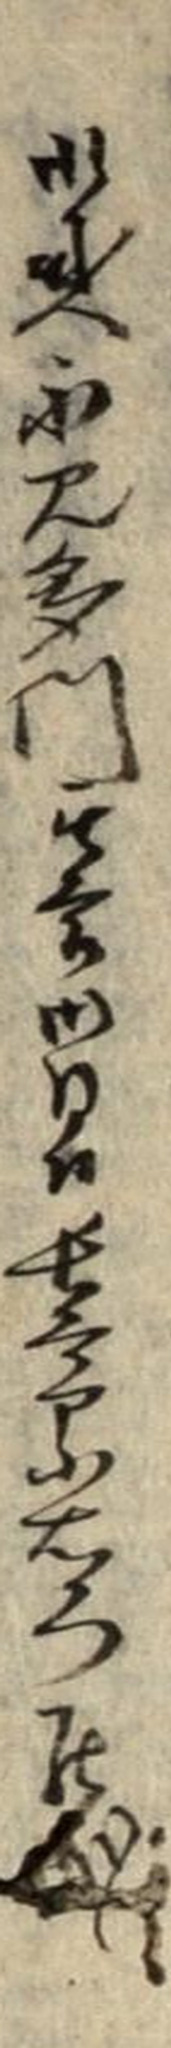御用人永見多門其節御目付長谷部小右衛門罷越候
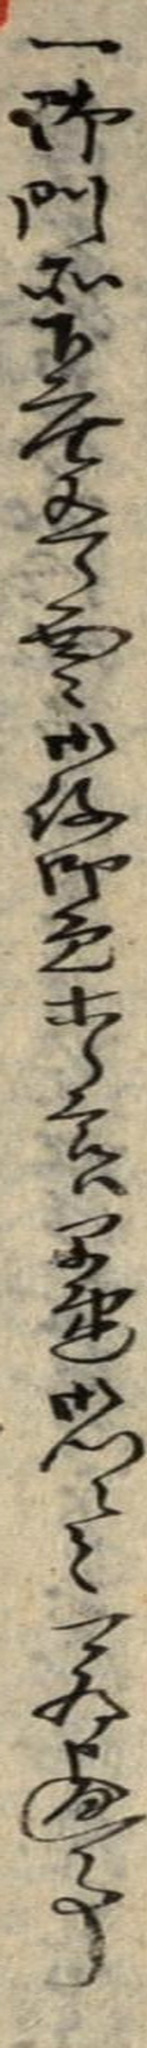一御門所下座有之候面々御役御免等之節は早速御門〳〵へ可為申通事

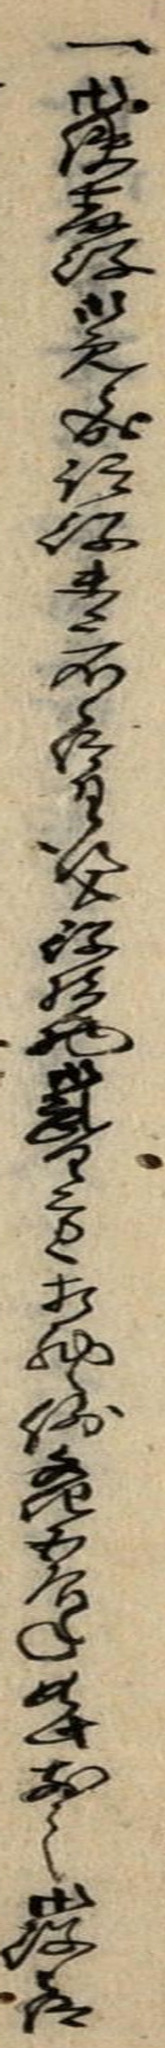一御使番役御免被成跡役未た不被仰付候得共役指物御武具方へ相納候例文化五辰年如此前之御役被仰
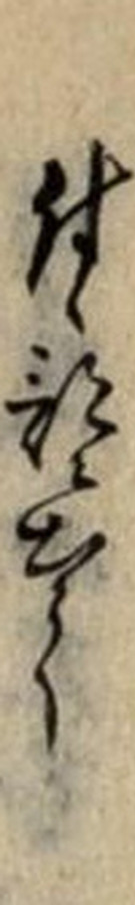付候部に出之
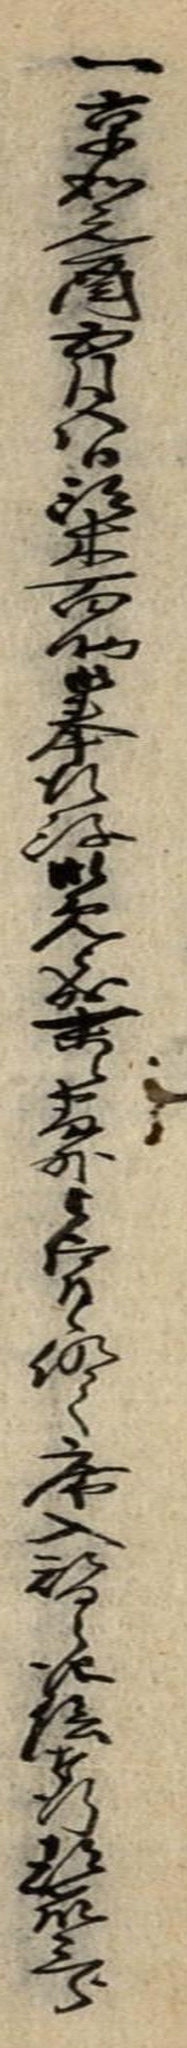一享和元酉五月八日鈴木百助御奉行役御免被成未之番外被仰付候仍之席入替之儀絵奉行都築三郎
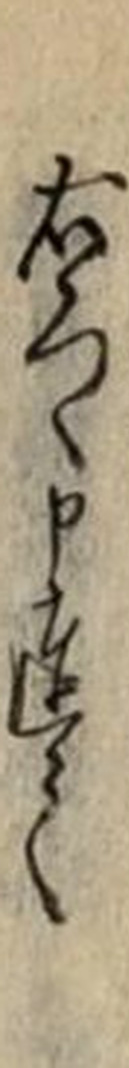右衛門へ申達之
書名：御用并被仰出之部
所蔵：福井県文書館 Fukui Prefectural Archives
